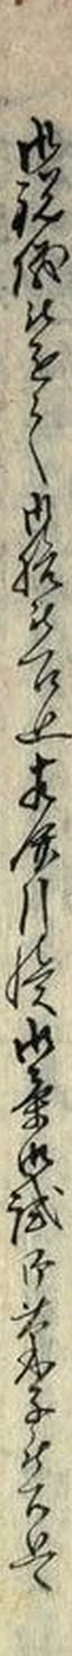御祝儀被進之御膳被召上相済引続御茶御試御菓子被召上候
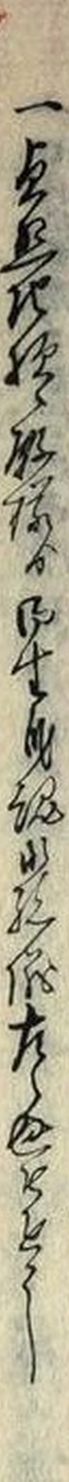一貞照院様へ殿様ゟ御生身魂御祝儀左之通被進之
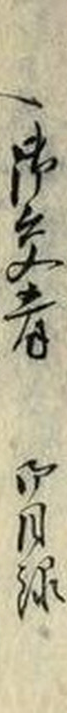御交肴御目録
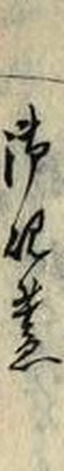御硯蓋
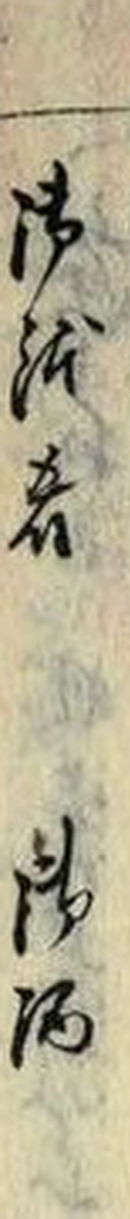御鉢肴御酒
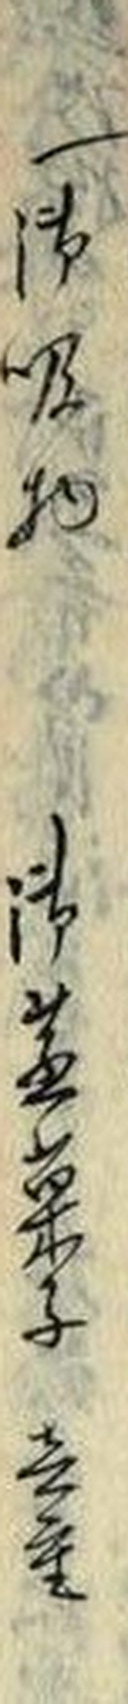御吸物御蒸菓子壱重

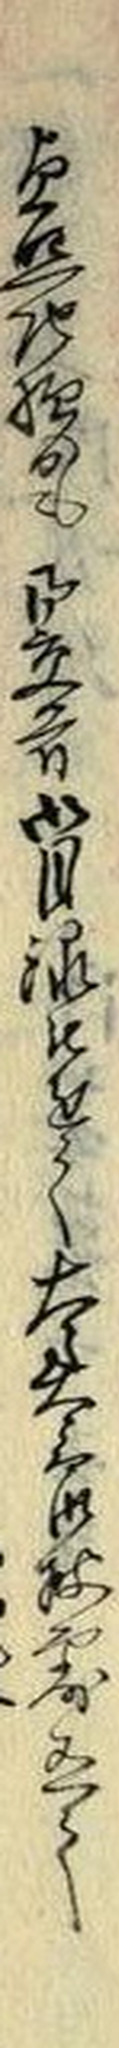貞照院様ゟも御交肴御目録被進之大奥ニ而御披露有之
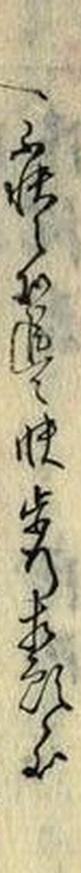不快之処追々快歩行相願候処
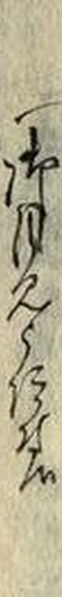御目見被仰付候
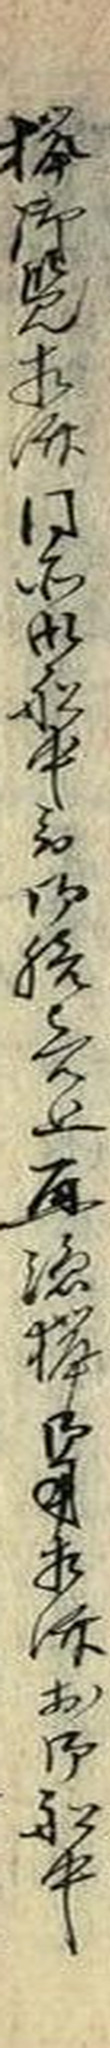猟御覧相済同所御船中ニ而御膳被召上再漁猟御用相済於御船中
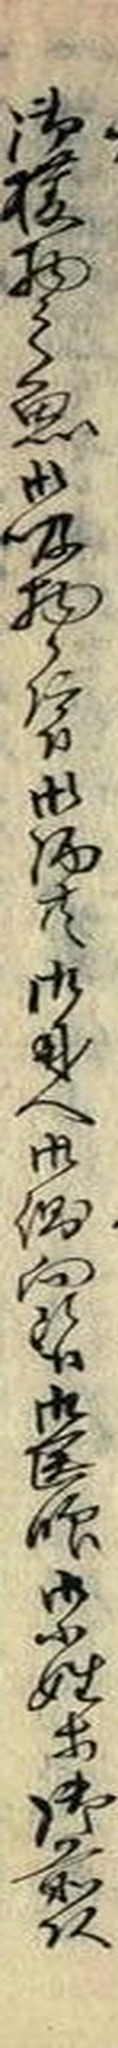御獲物之魚御吸物被仰付御酒共御用人御側向頭取御医師御小姓等御前頂
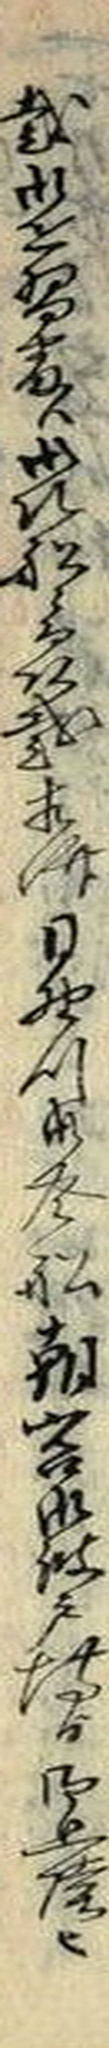戴御近習番ハ御次船ニ而頂戴相済日野川御登船朝宮御波戸場ゟ御上陸被
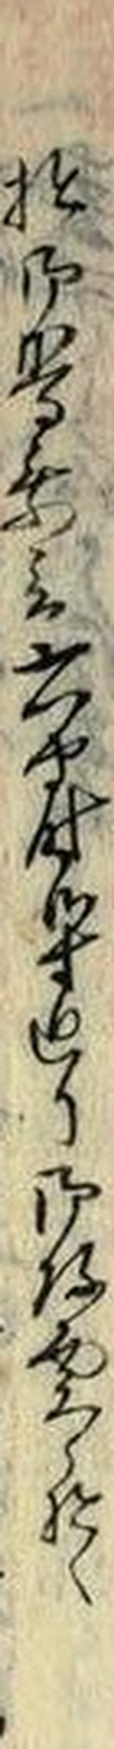遊御駕乗ニ而六半時弐寸廻り御帰殿被遊候
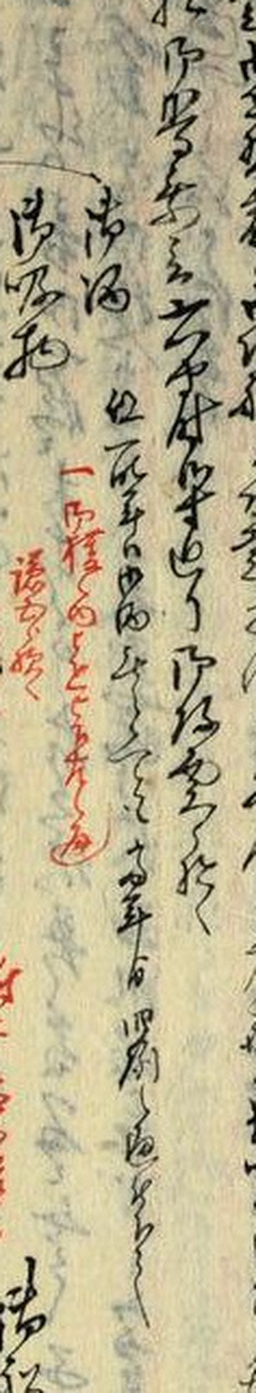御酒但一昨年ハ酒無之候ヘとも当年ゟ旧例之通被下之
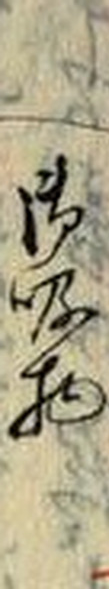御吸物
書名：少傅日録抄（斉承付側向頭取日記、在国）
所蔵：福井県文書館 Fukui Prefectural Archives
